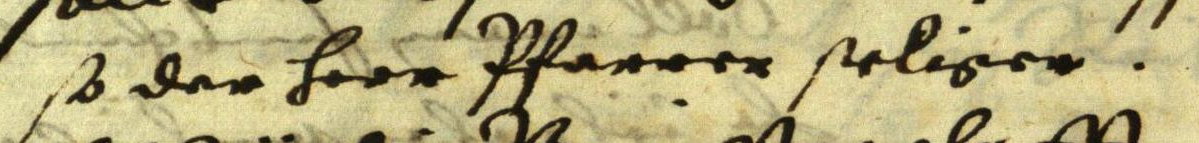so der herr Pfarrer seliger.
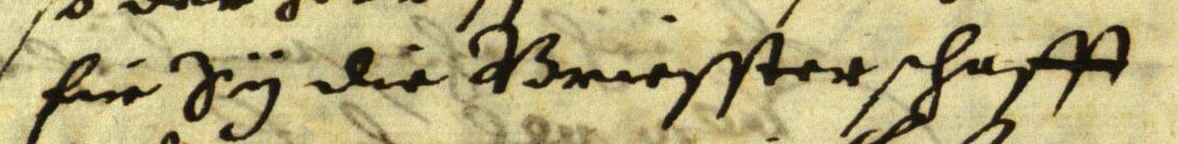für Sÿ die Briessterschafft
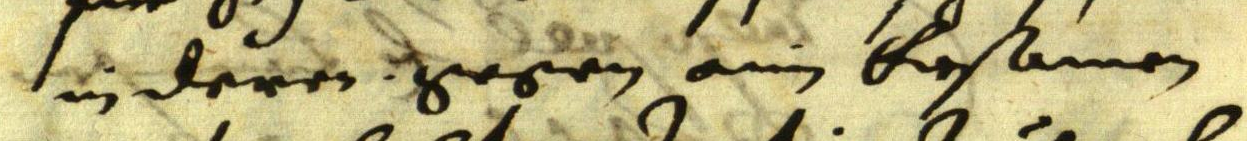in deren. gegen ain Ersamen
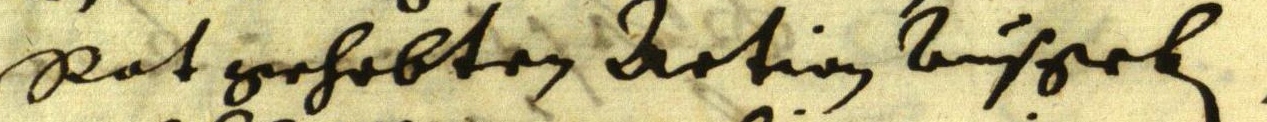Rat gehalten Action Aūsgeb
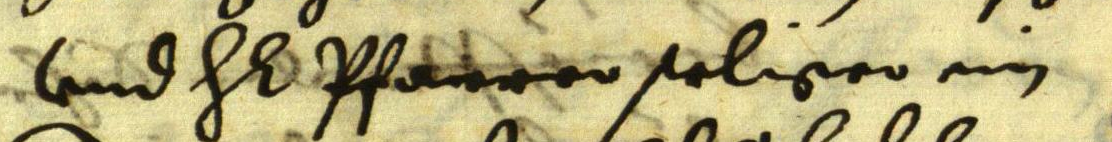vnd h Pfarrer seliger im
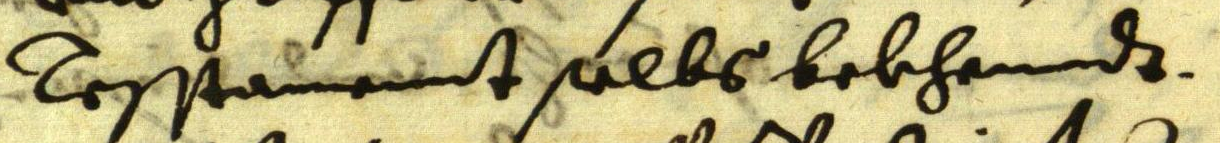Testament selbs bekhenndt.
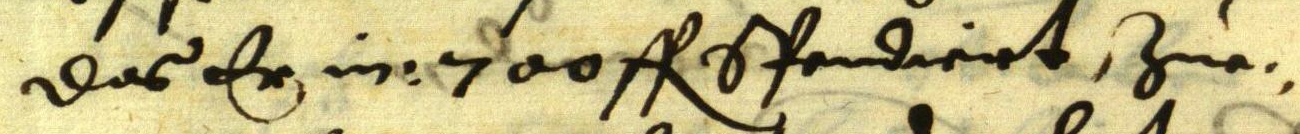das Er in: 700 fl Spendiert, Zūe¬
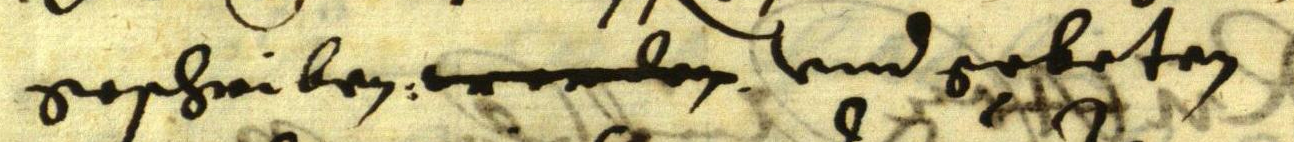geschriben: werden. vnd gebeten
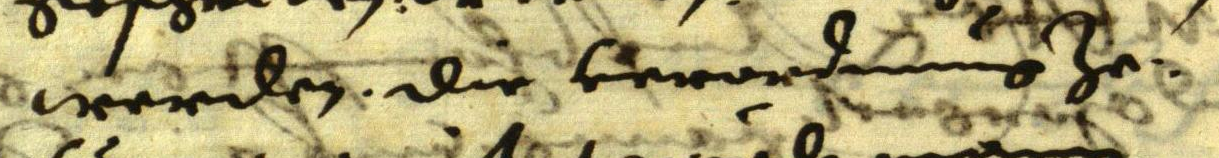werden. die verordnūng Ze¬
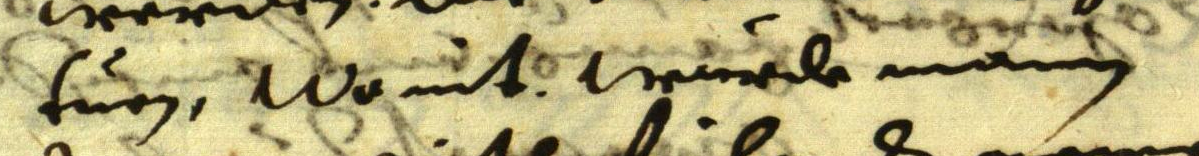tūen, Wo nit. wūrde mann
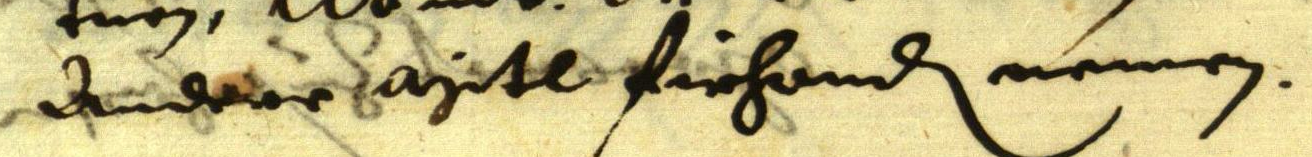Andrer Mitl firhand nemen.
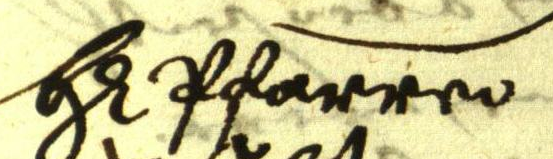H Pfarrer
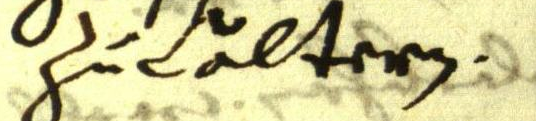Zū Caltern.
